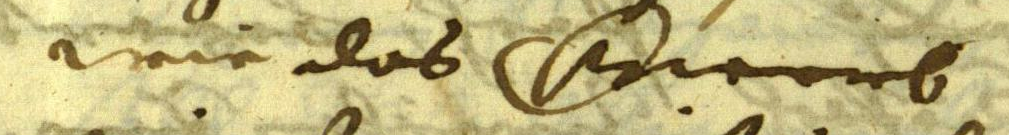wie das Gwerb
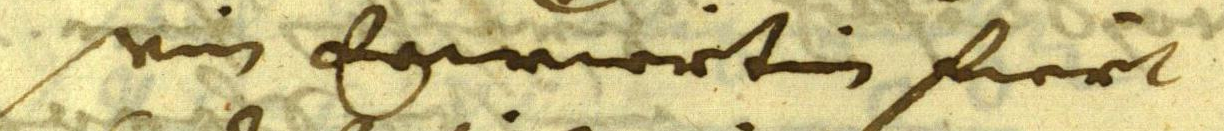sein Eewiertin fiert
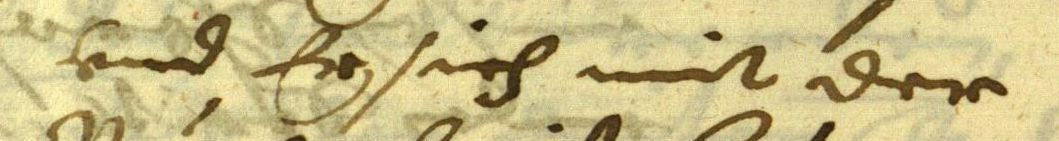vnd Er sich mit der
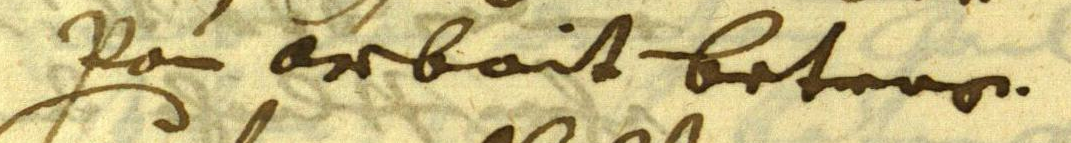Paū arbait betrag.
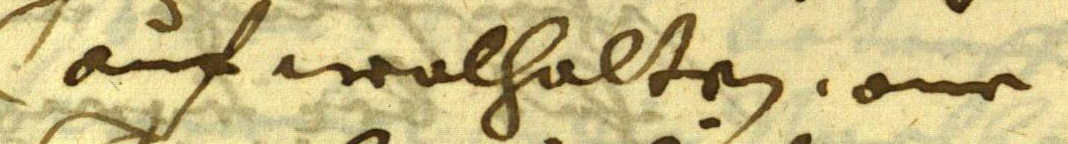aūf wolhalten. one
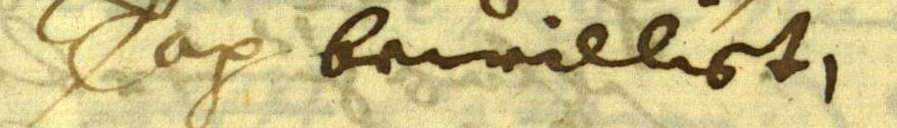Tax bewilligt,
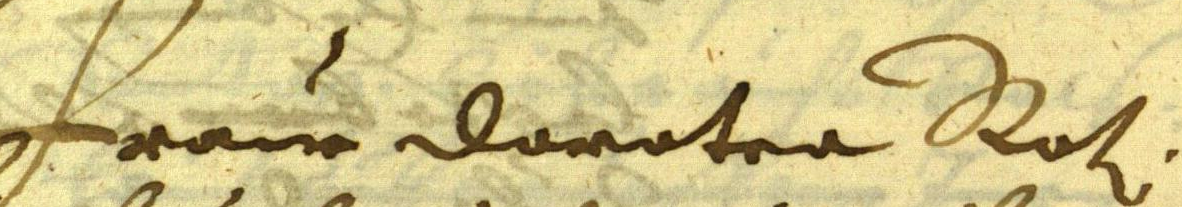Fraūe dorotea Rot¬
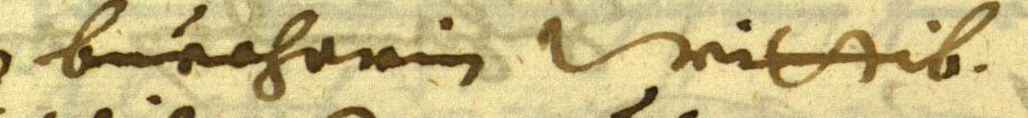būecherin Wittib.
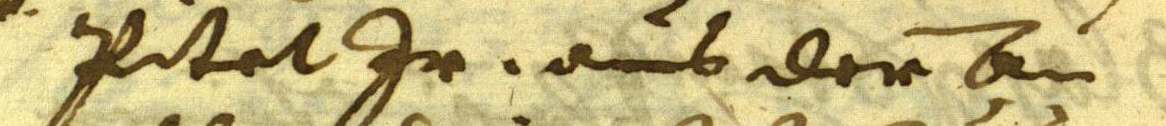Pitet Ir. aūs der Aū
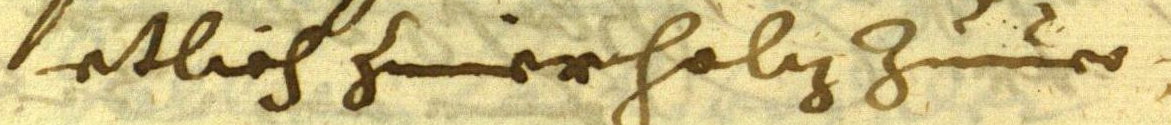etlich Zimerholz Zūūer¬
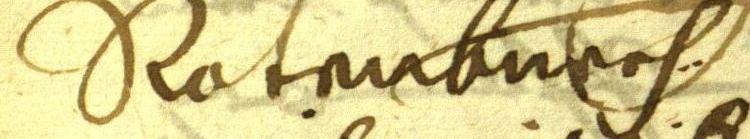Rotenbūech¬
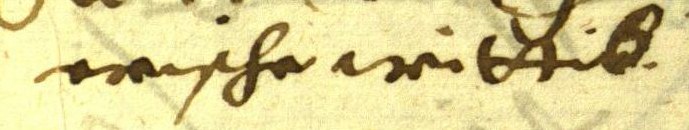erische Wittib.
